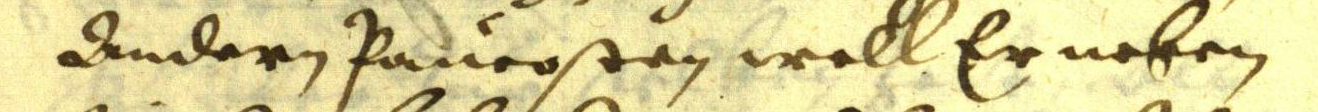Andern Paūcosten well Er neben
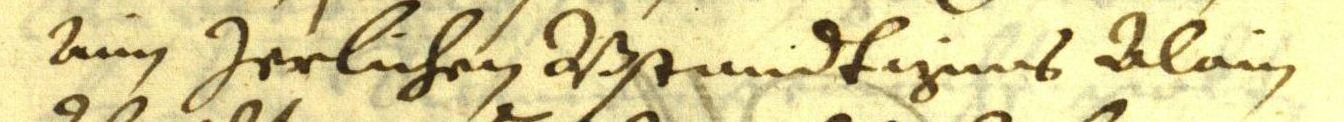Aim Jerlichen Bstandtzins Alain
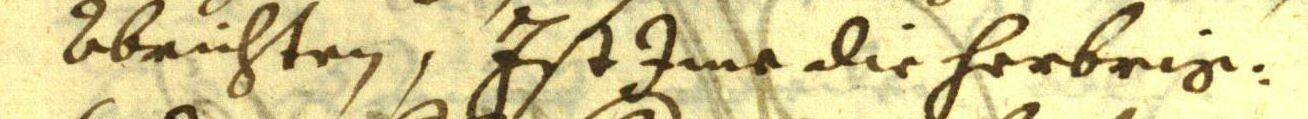Abrichten, Ist Ime die herbrig¬
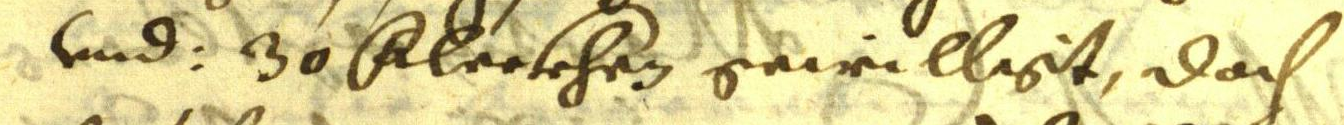vnd: 30 fleckhen gewilligt, doch
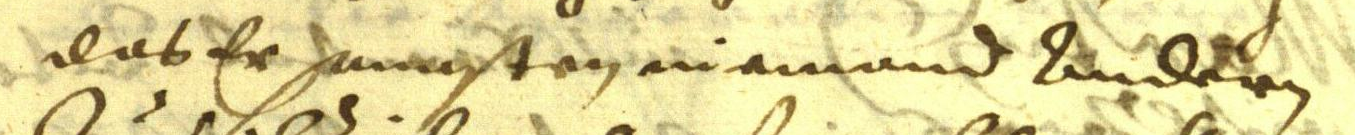das Er sonnsten niemand Andern
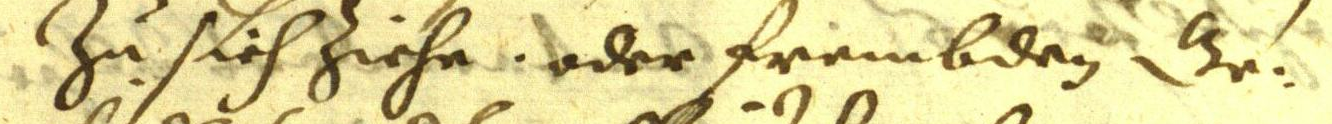Zū sich ziehe. oder frembden Ge¬
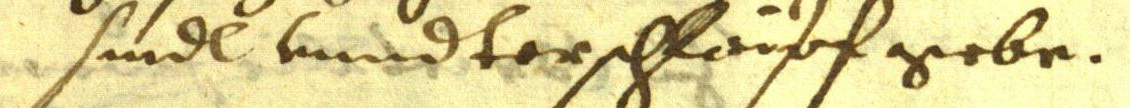sindl vnndterschlaipf gebe.
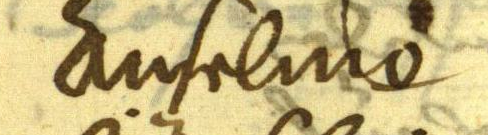Anselmo
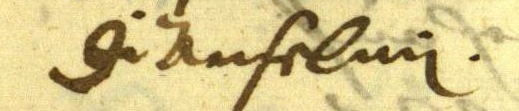di Anselmj.
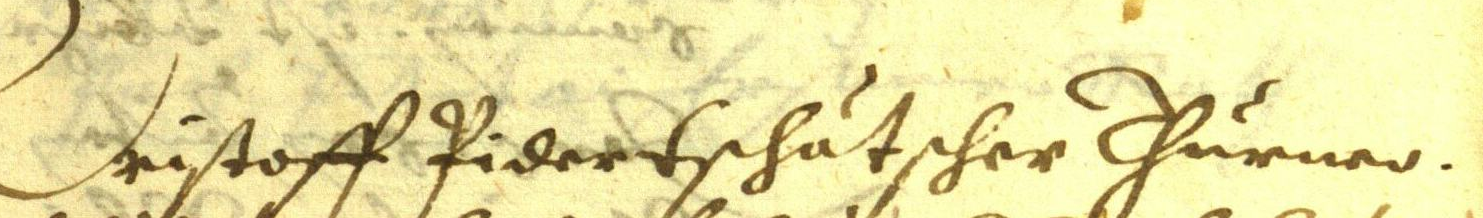Cristoff Pidertschätscher Thūrner.
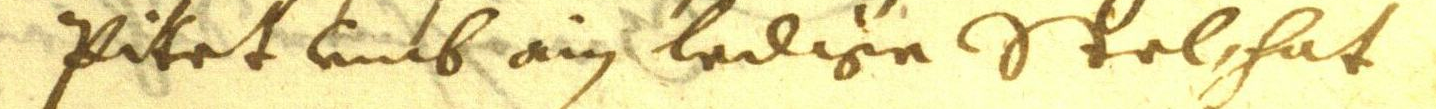Pitet vmb ain ledige Stel, hat
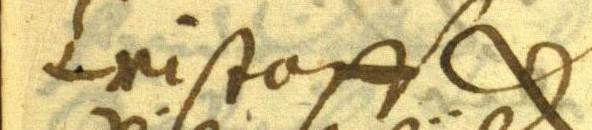Cristoff
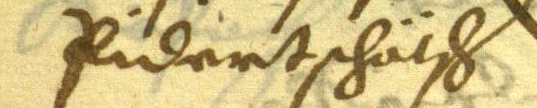Pidertschätsch
